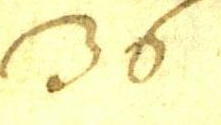36
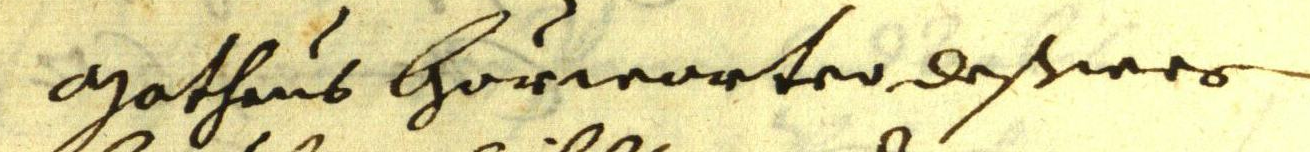Matheūs Hōrwarter desweg
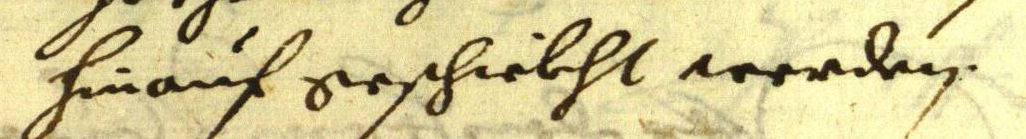hinaūf geschickht werden.
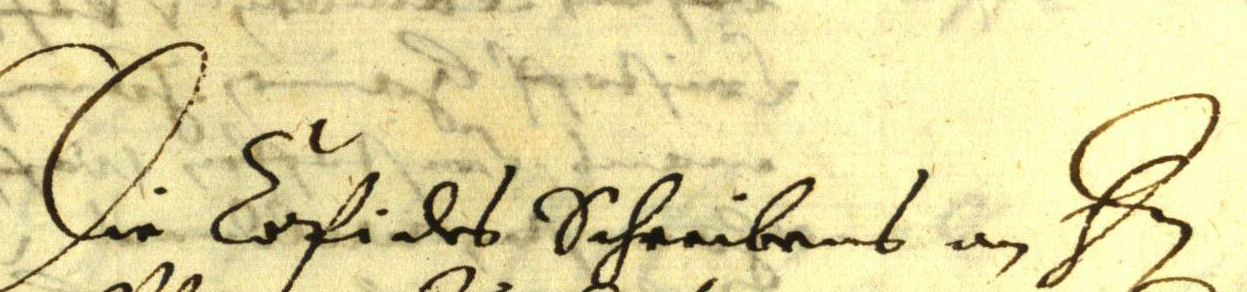Die CoPi des Schreibens an hn
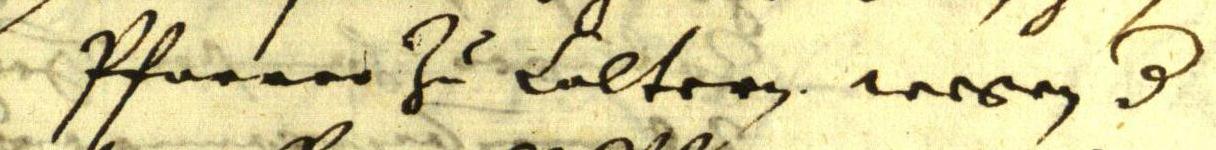Pfarrer Zū Caltern. wegen d
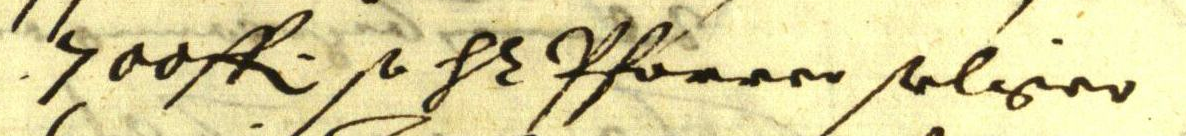.700 fl. so h Pfarrer seliger
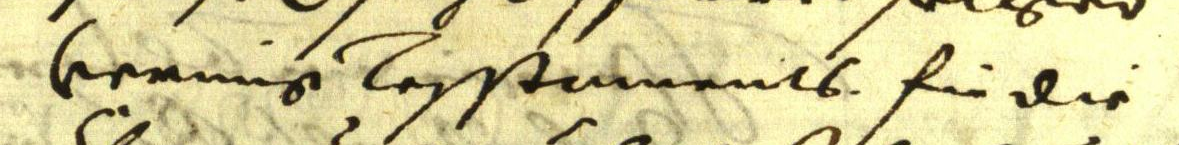Vermig Tesstaments. fir die
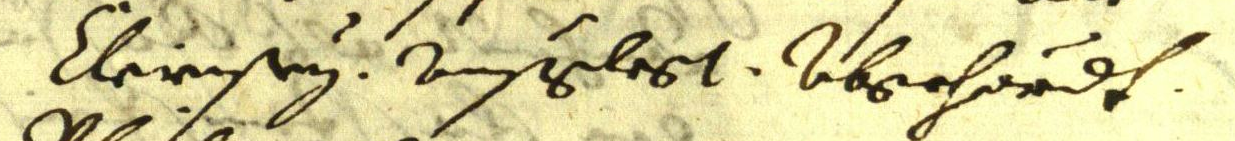Cleriseȳ Aūsgelegt. Abgehōrdt.
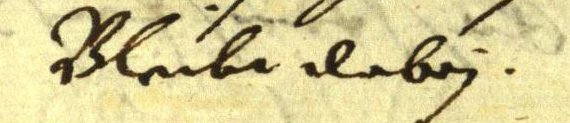Bleibt dabej.
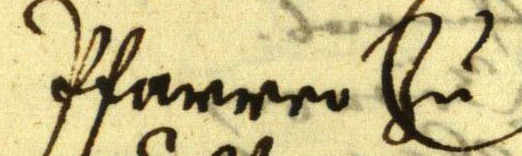Pfarrer Zū
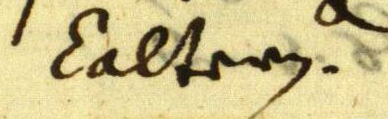Caltern.
